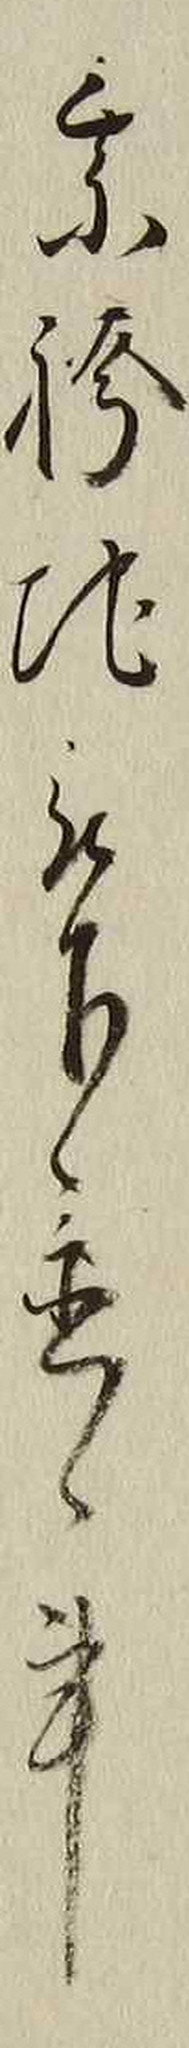乗袴地被下置候事
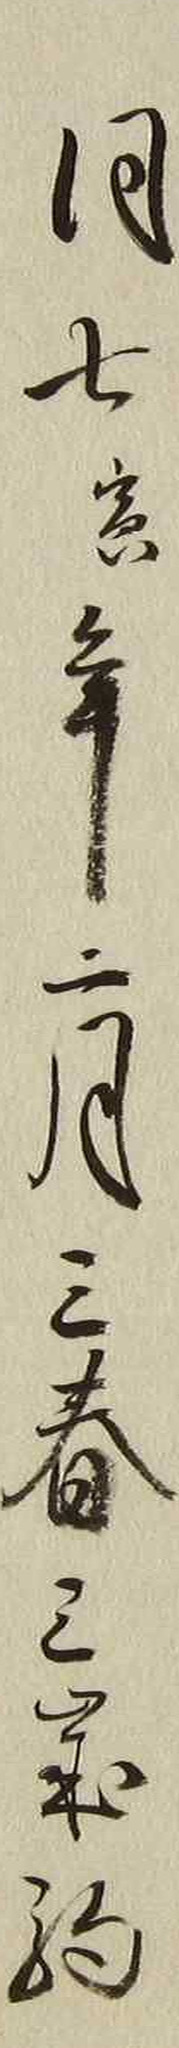一同七寅年二月三春三歳駒
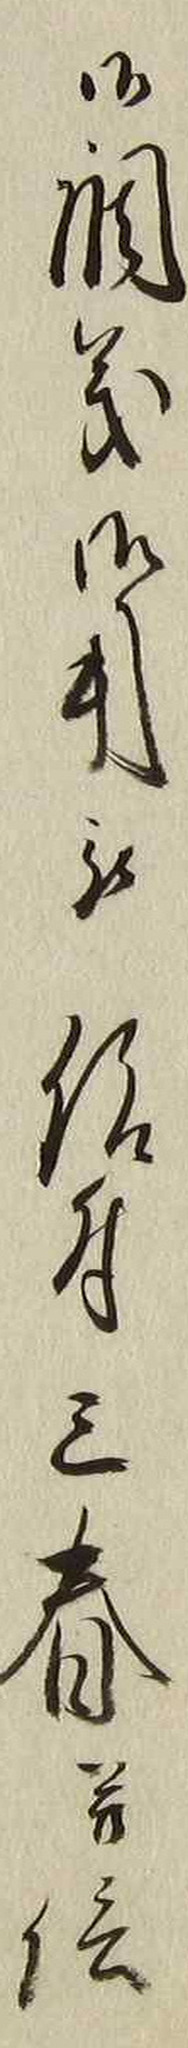御調義御用被仰付三春并信
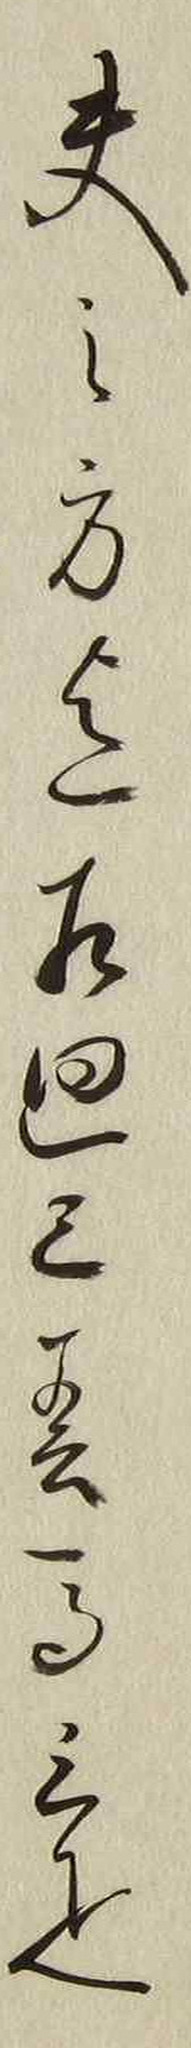夫之方迄相廻三春馬三疋
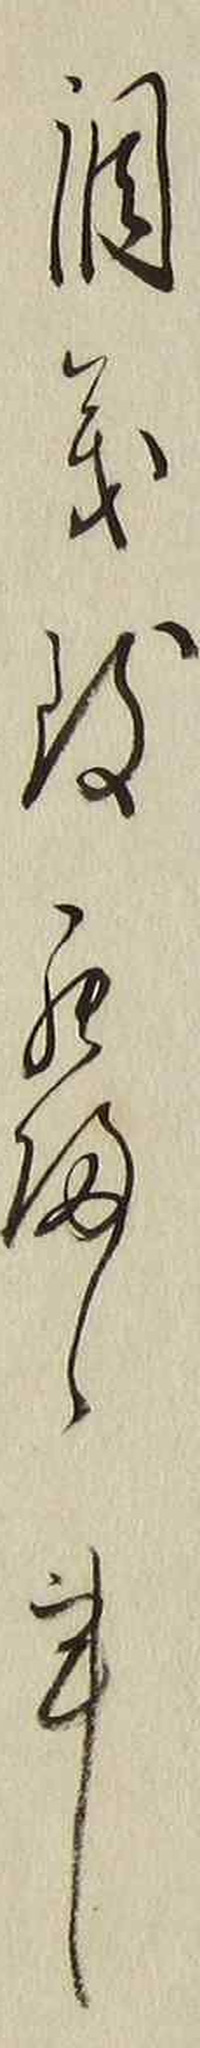調義致罷帰候事
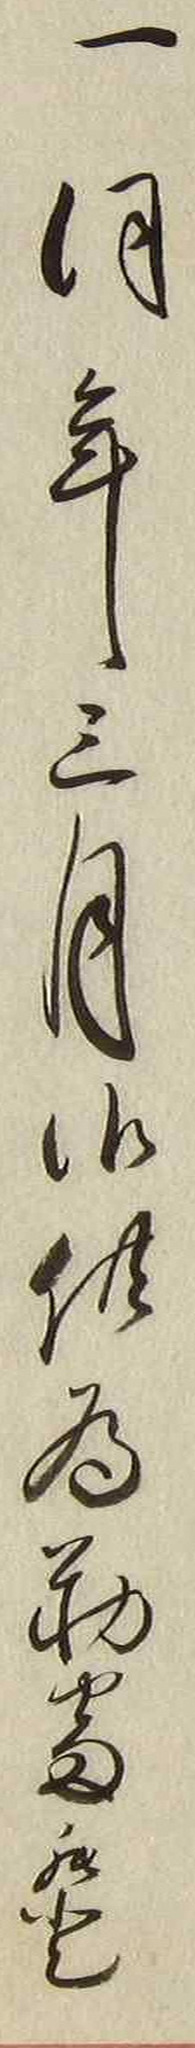一同年三月御供為勤番罷登
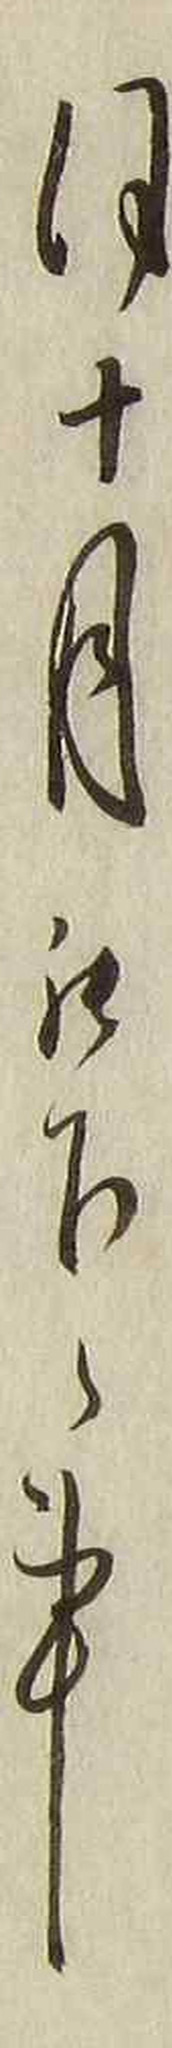同十月罷下候事
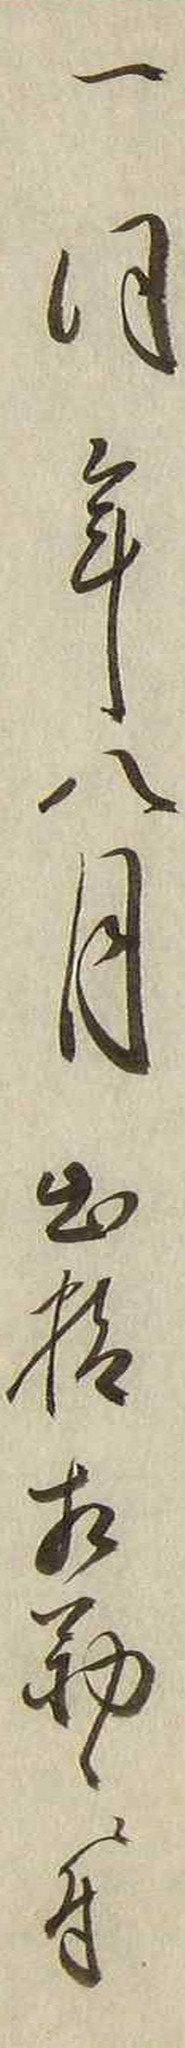一同年八月出精相勤候ニ付

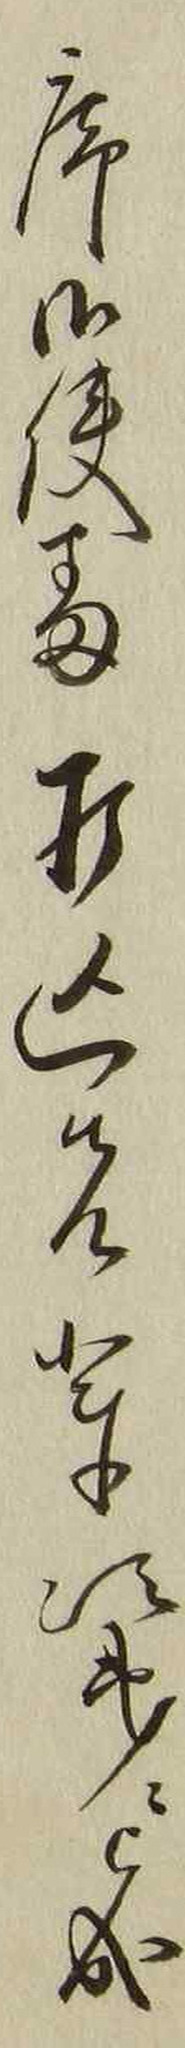席御使番打込先輩次第に被成
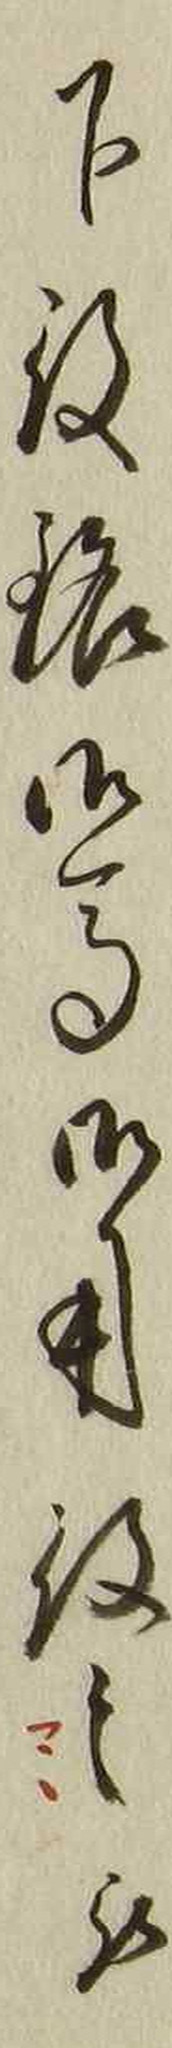下役銘御馬御用役之被
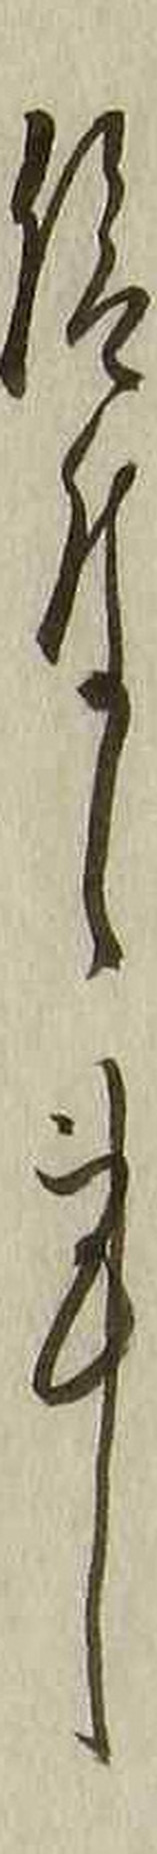仰付候事
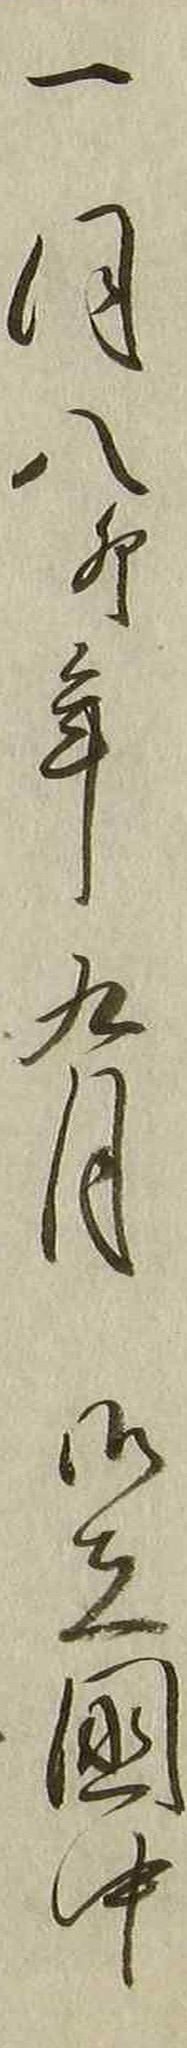一同八卯年九月御在国中
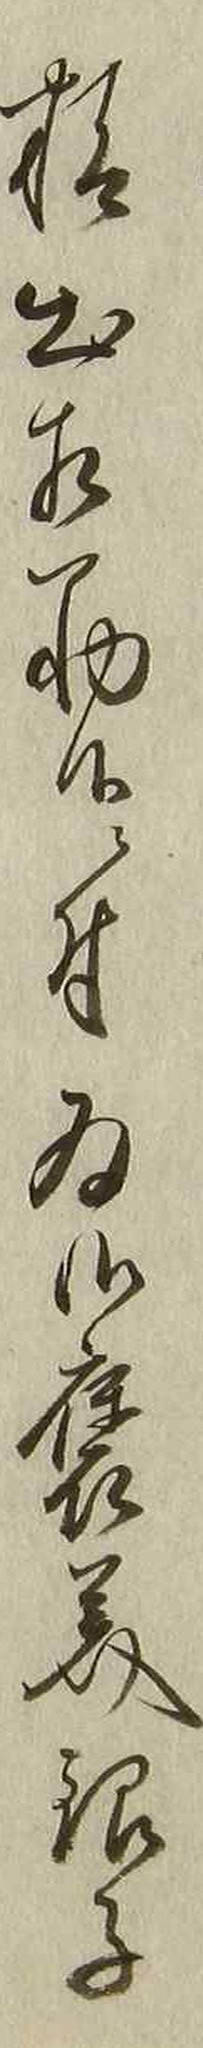精出相勤候ニ付為御褒美銀子
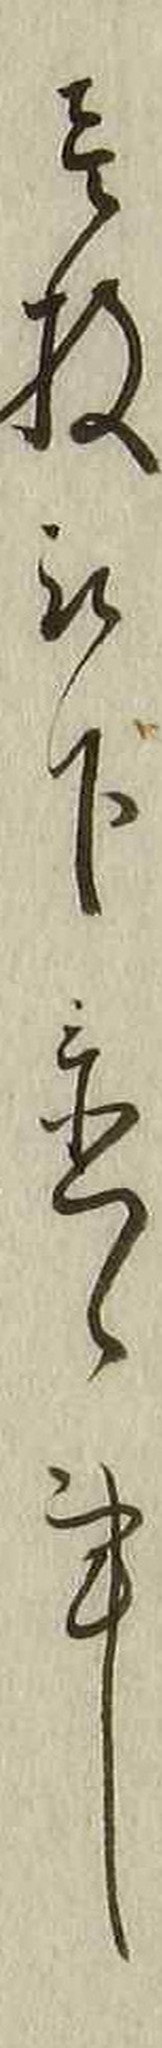壱枚被下置候事
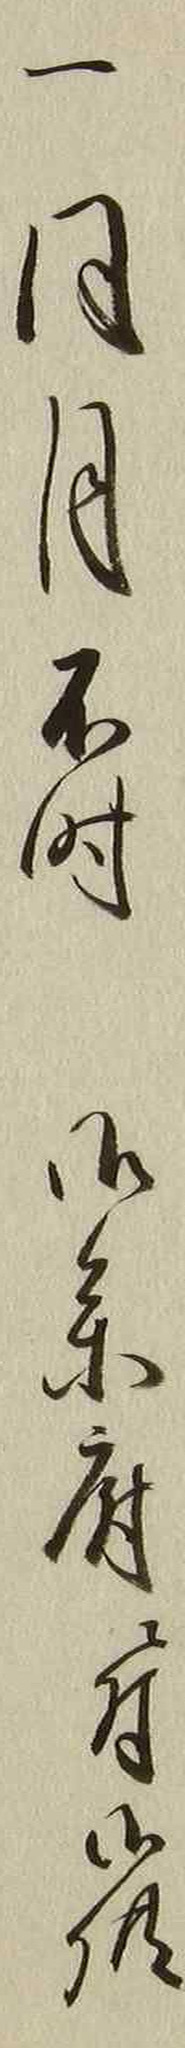一同月不時御参府ニ付御供
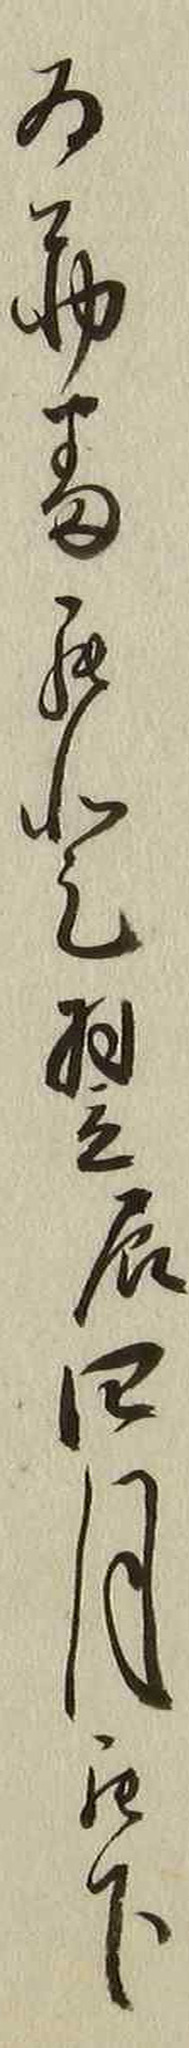為勤番罷登翌辰四月罷下
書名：諸士系譜　巻之18　い之部18
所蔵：会津若松市立会津図書館
